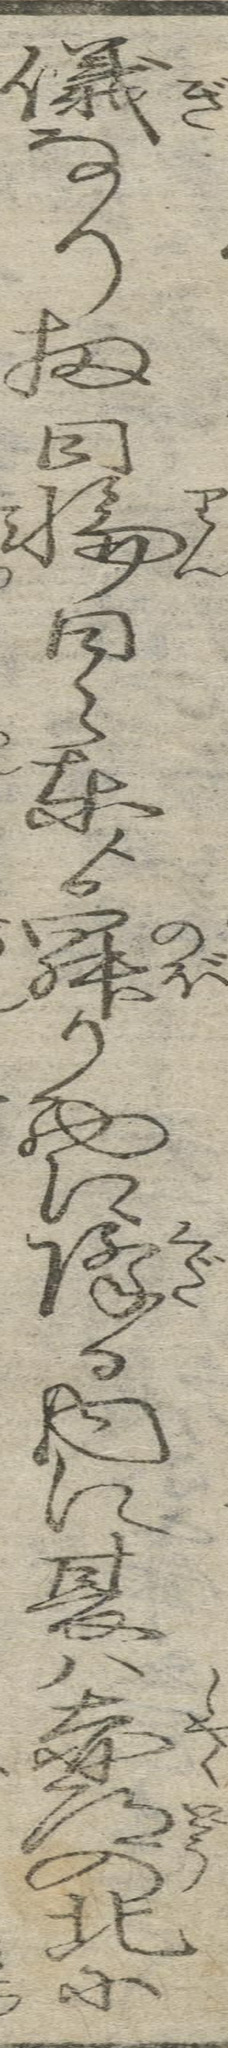儀なり扨日輪日々東ゟ昇り西に降る内に夏は赤道の北に
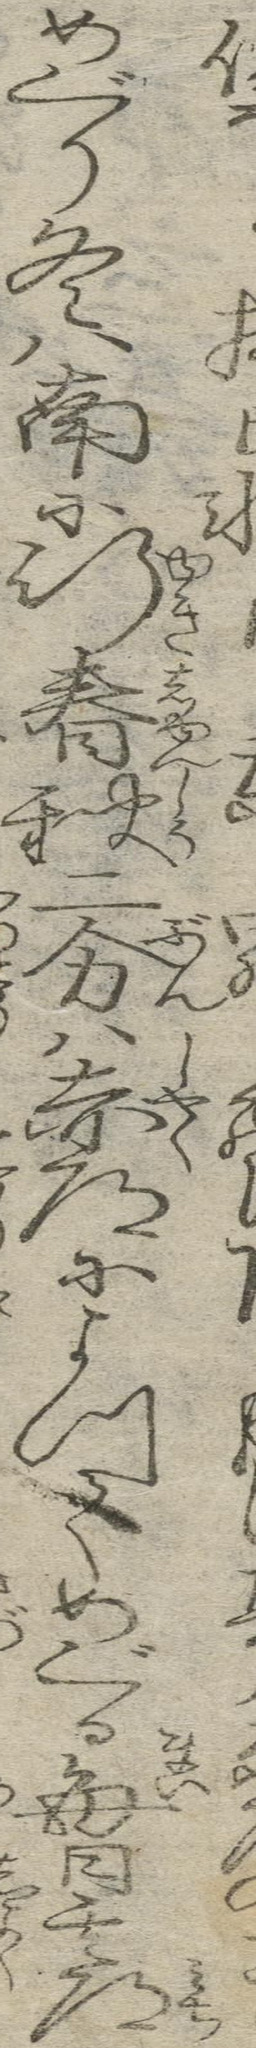めぐり冬は南に行春秋二分は赤道によつてめぐる毎日其道
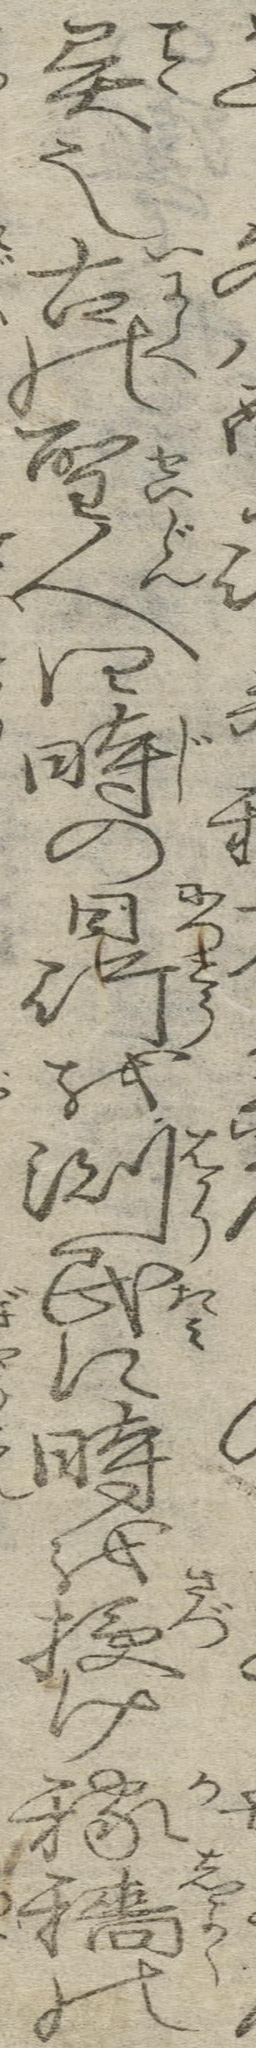異也古の聖人四時の日行を測民に時を授け稼穡の
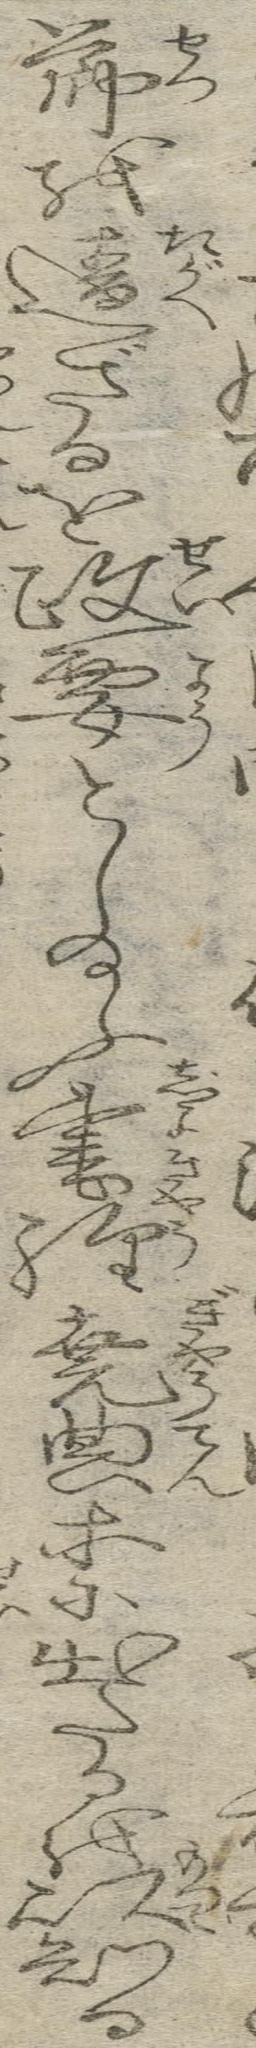節を違ざるを政要とし給ふ書経堯典等に出たるを以知る
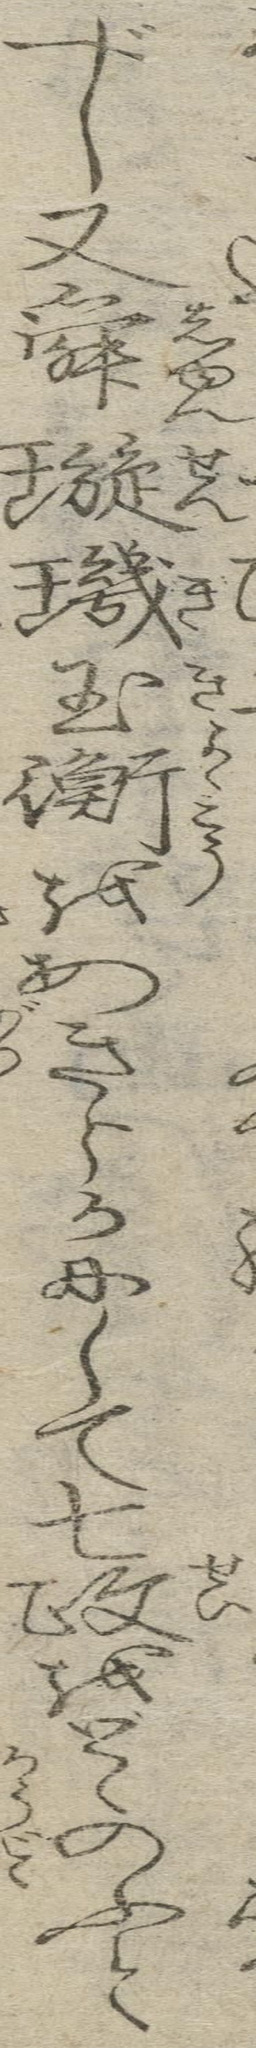べし又舜璇璣玉衡をあきらかにして七政をとゝのふと
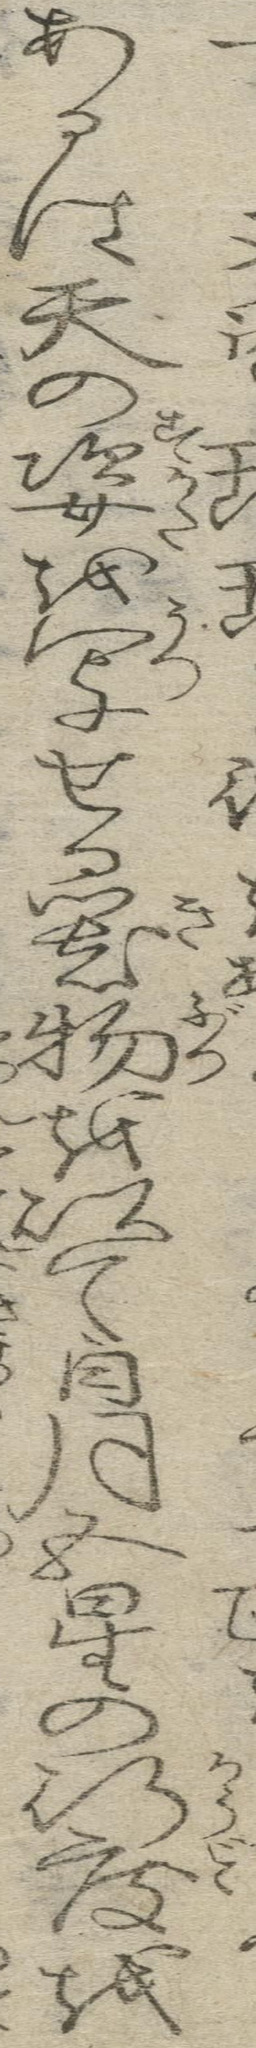あるは天の姿を写せる器物を以て日月五星の行度を
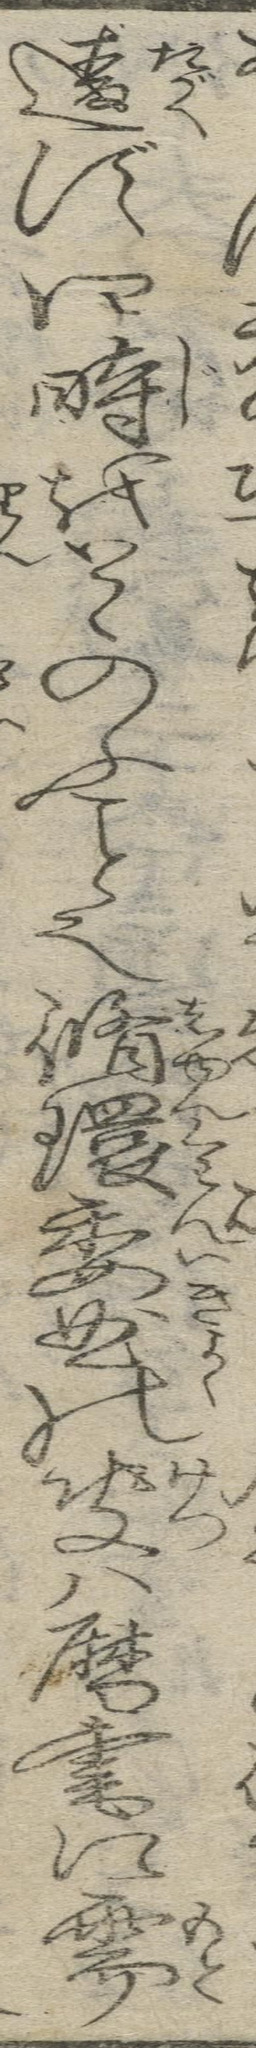違ず四時をとゝのふこと也循環委曲の決は暦書に需
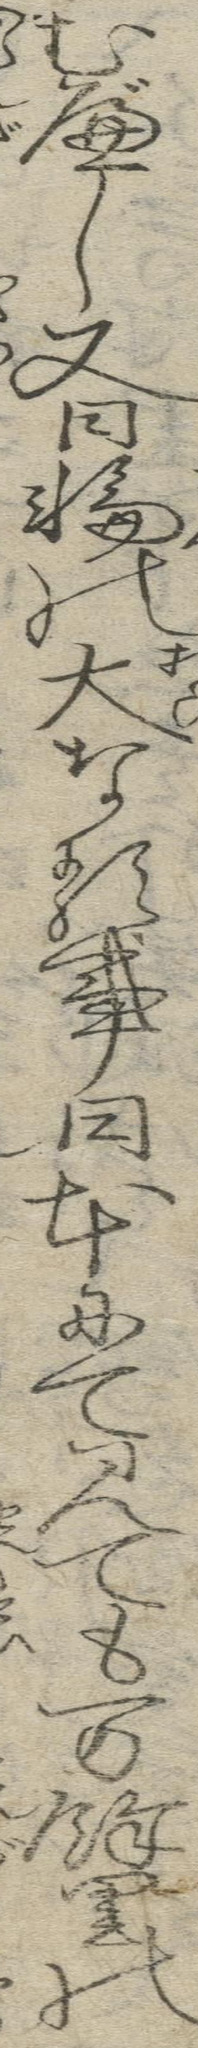むべし又日輪の大なる事日本にて見ても万余里の
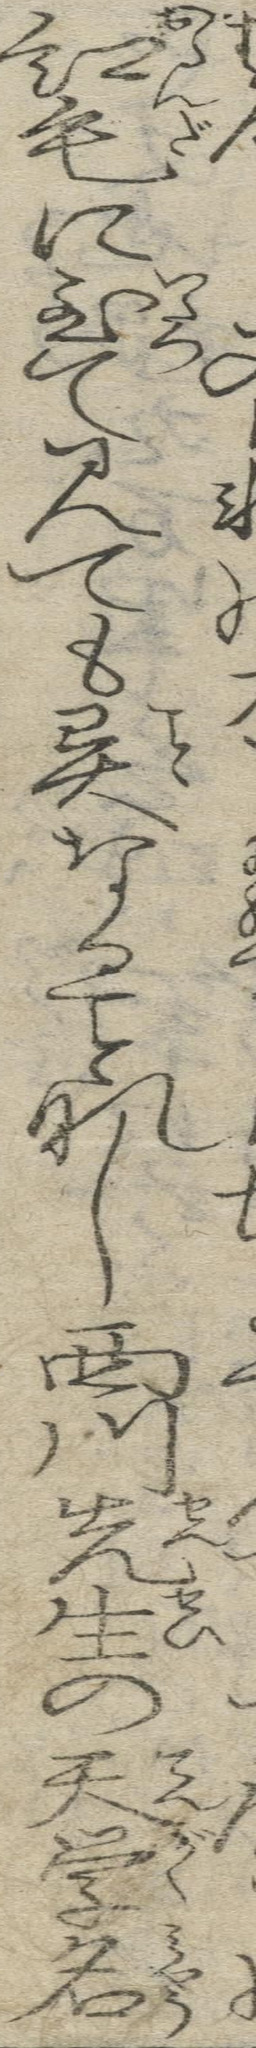紅毛に至て見ても異なることなし西川先生の天学名
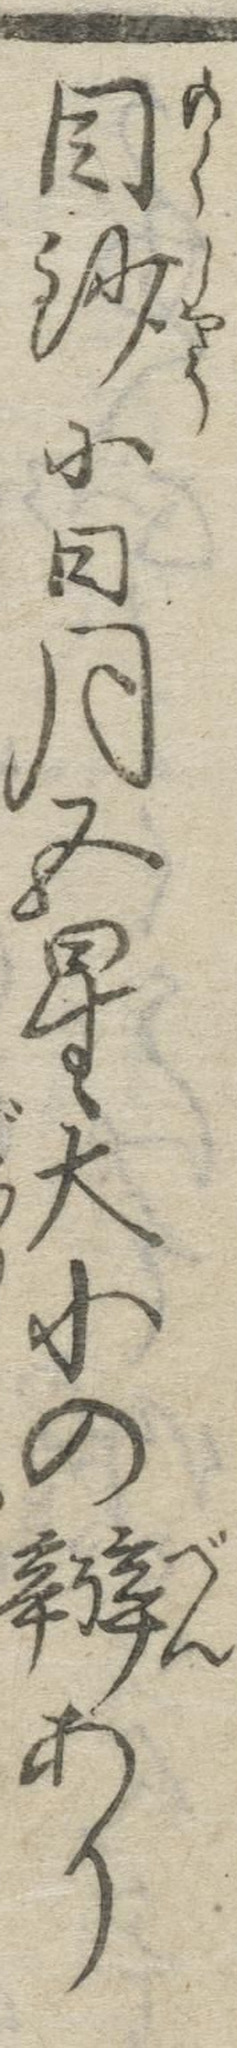目鈔に日月五星大小の弁あり
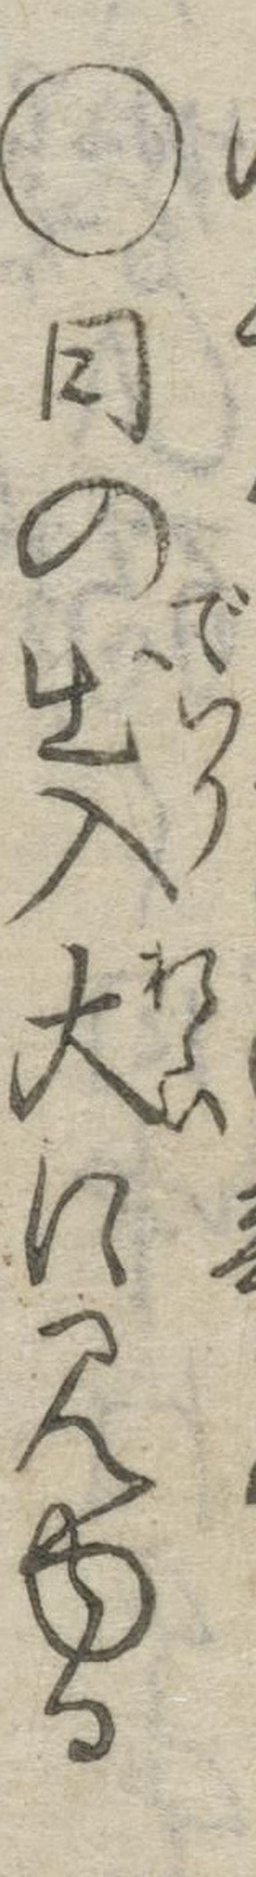○日の出入大に見ゆる
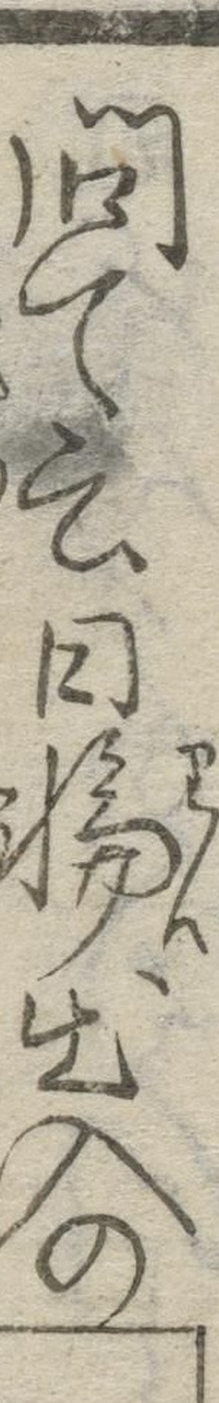問て云日輪出入の
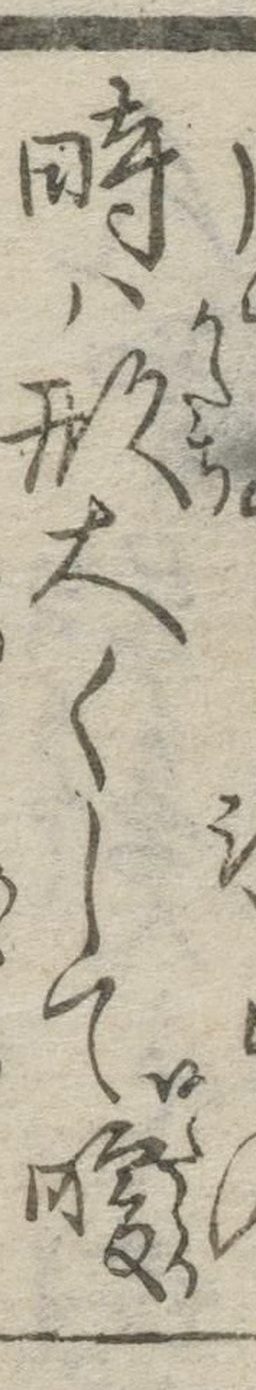時は形大くして暖
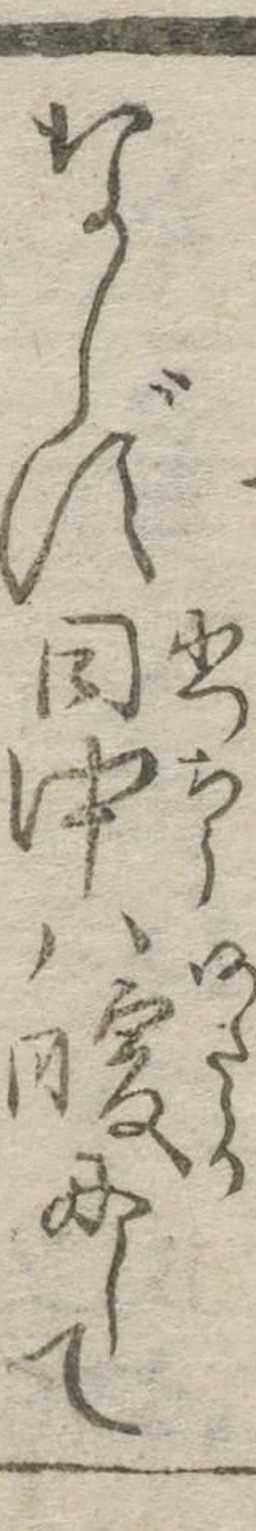ならず日中は暖にして
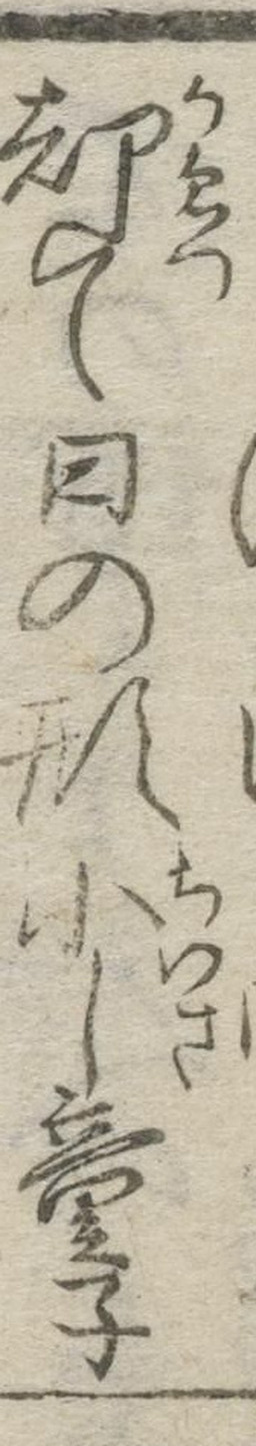却て日の形小し童子
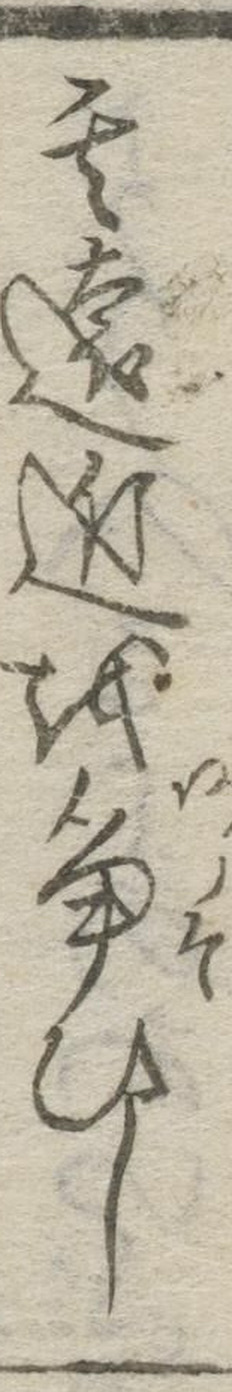其遠近を争ひし
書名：訓蒙天地辨　天
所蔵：東京大学地震研究所図書室 Earthquake Research Institute Library, The University of Tokyo, JAPAN
